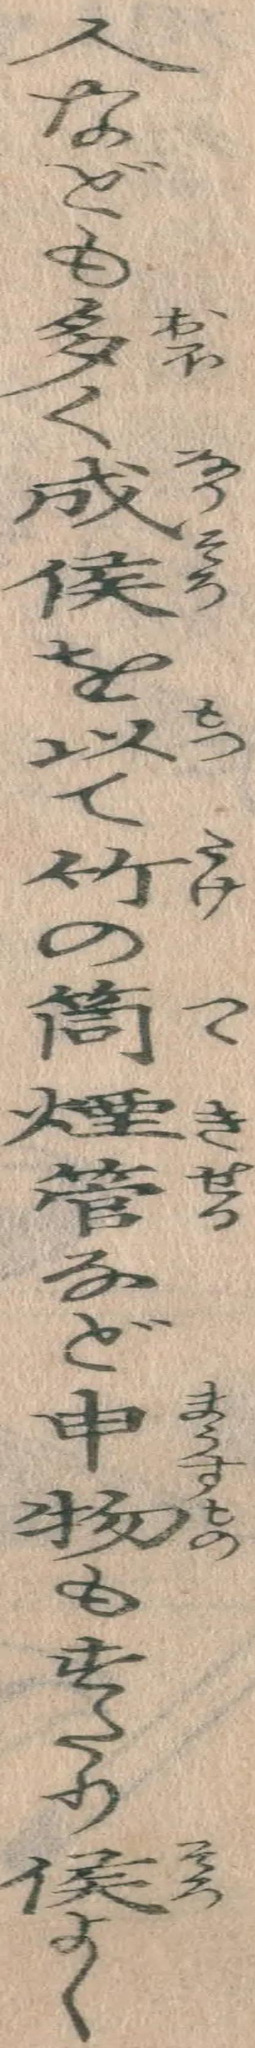人なども多く成侯を以て竹の筒煙管など申物もすたり侯よし
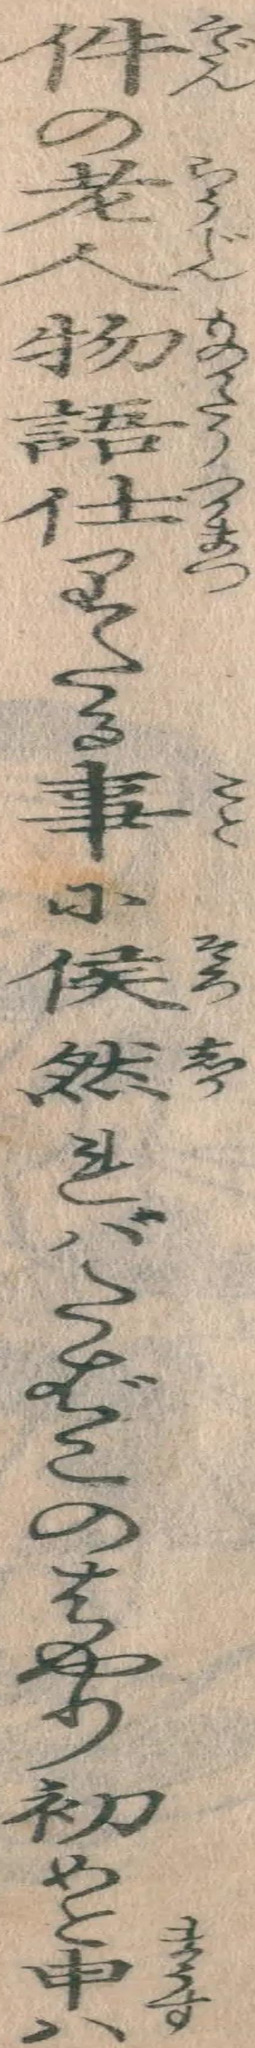件の老人物語仕りたる事に侯然ればたばこのはやり初めと申は
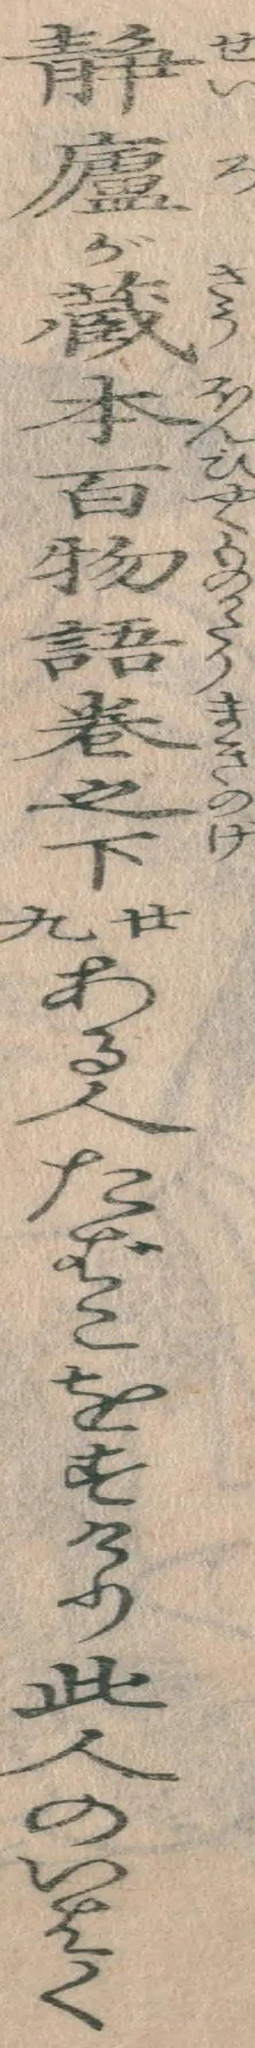静盧が蔵本百物語巻之下廿九ある人たばこをすけり此人のいはく
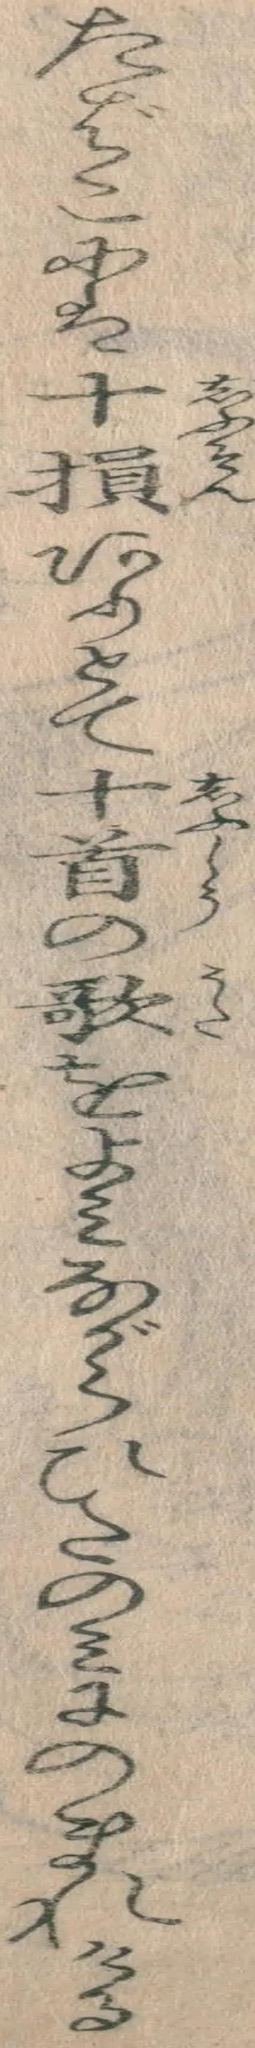たばこには十損ありとて十首の歌をよみながらひたのみにのまれける
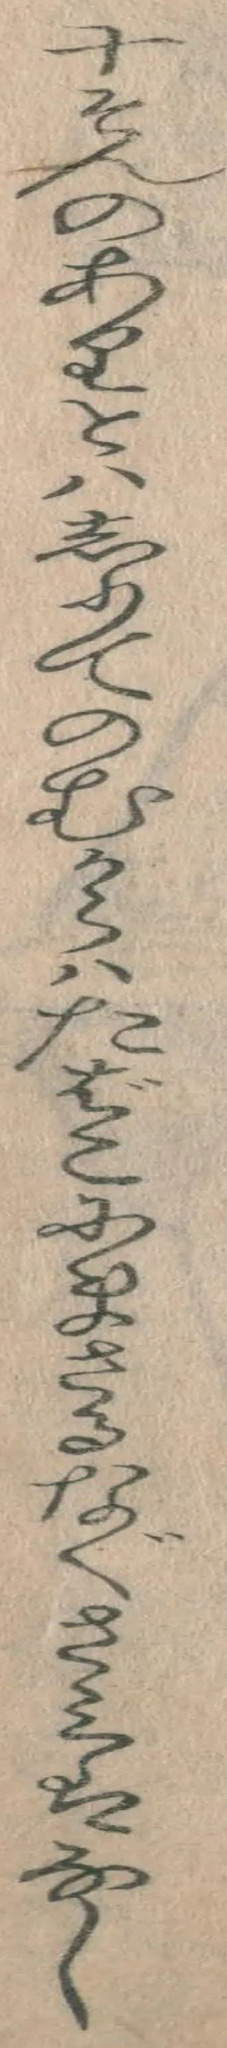十そんのありとはしりてのむからはたばこにまさるなぐさみはなし

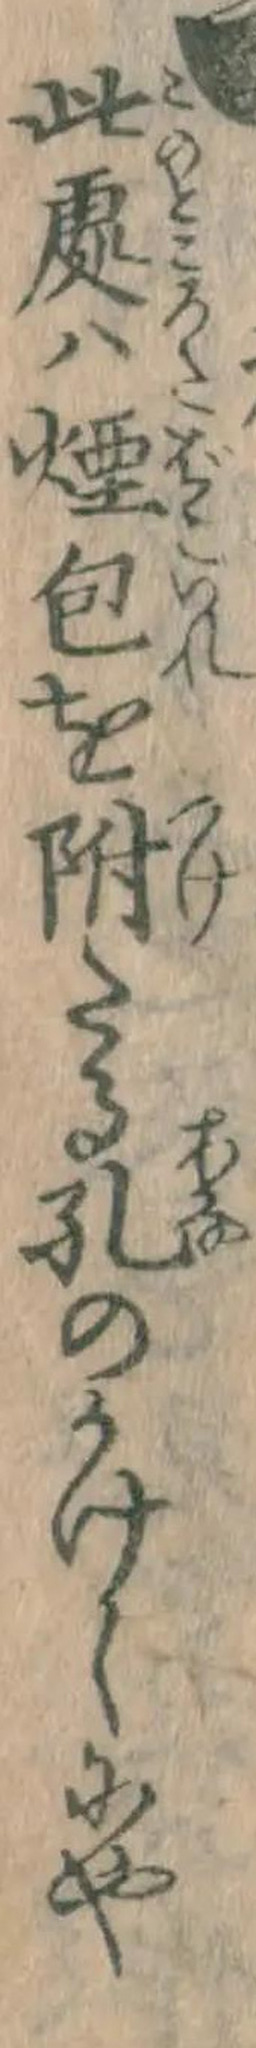此處は煙包を附たる孔のかけしにや

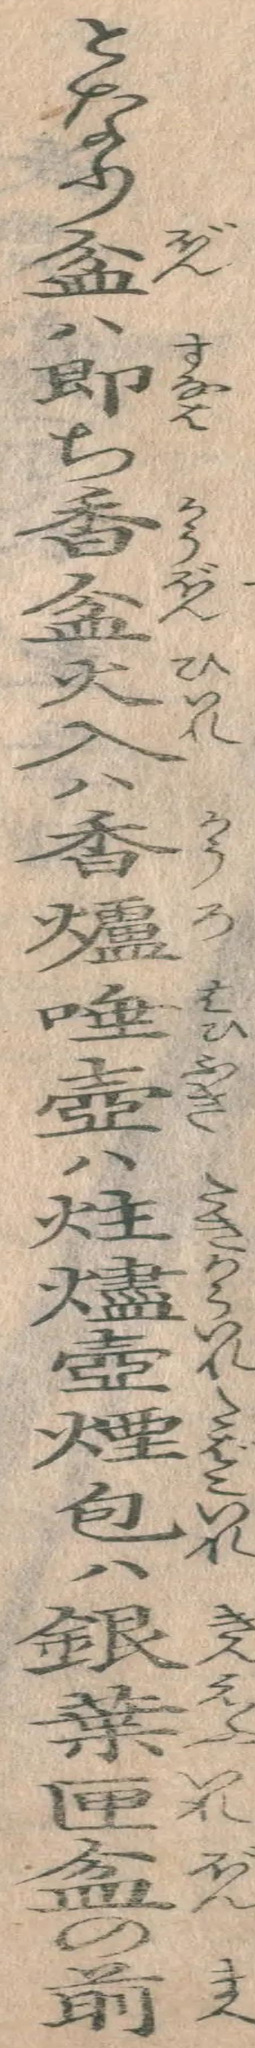となり盆は即ち香盆火入は香炉唾壺は炷燼壺煙包は銀葉匣盆の前
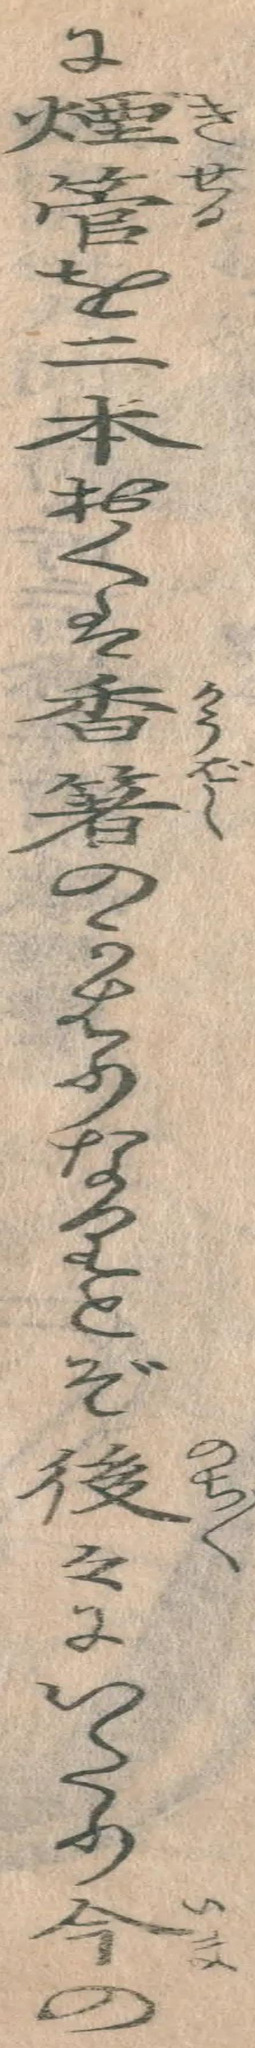に煙管を二本おくは香箸のかはりなりとぞ後々にいたり今の
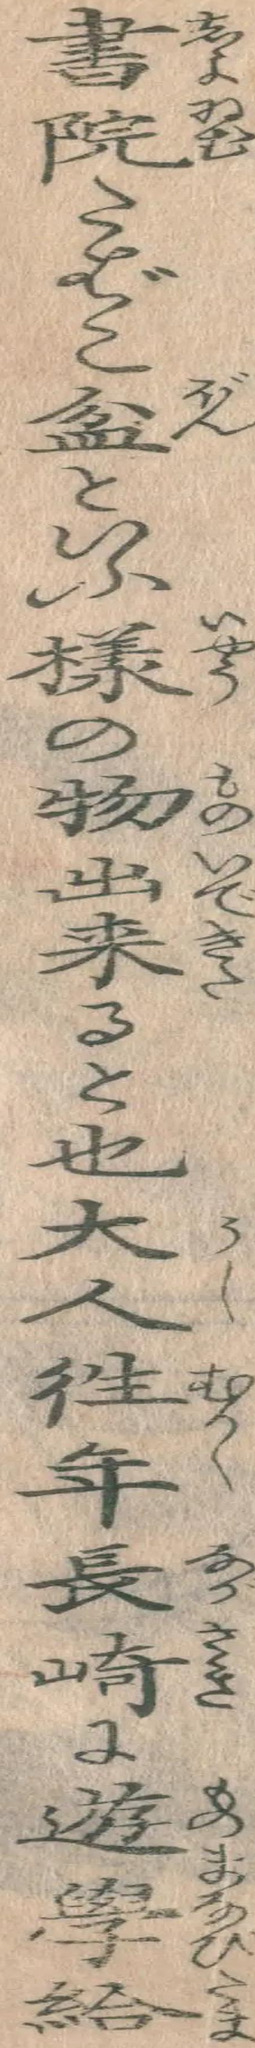書院たばこ盆といふ様の物出来ると也大人往年長崎に遊学給
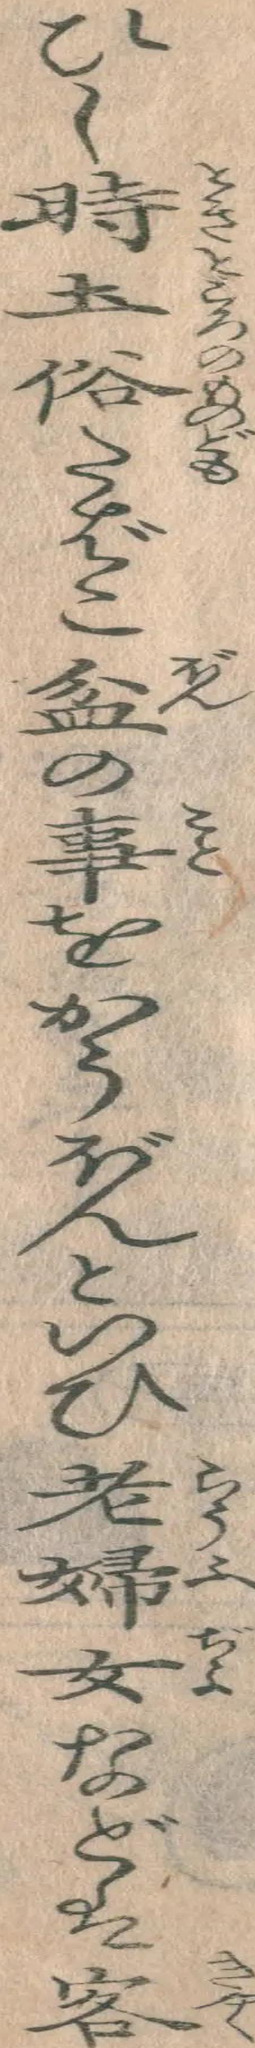ひし時土俗たばこ盆の事をかうぼんといひ老婦女などは客
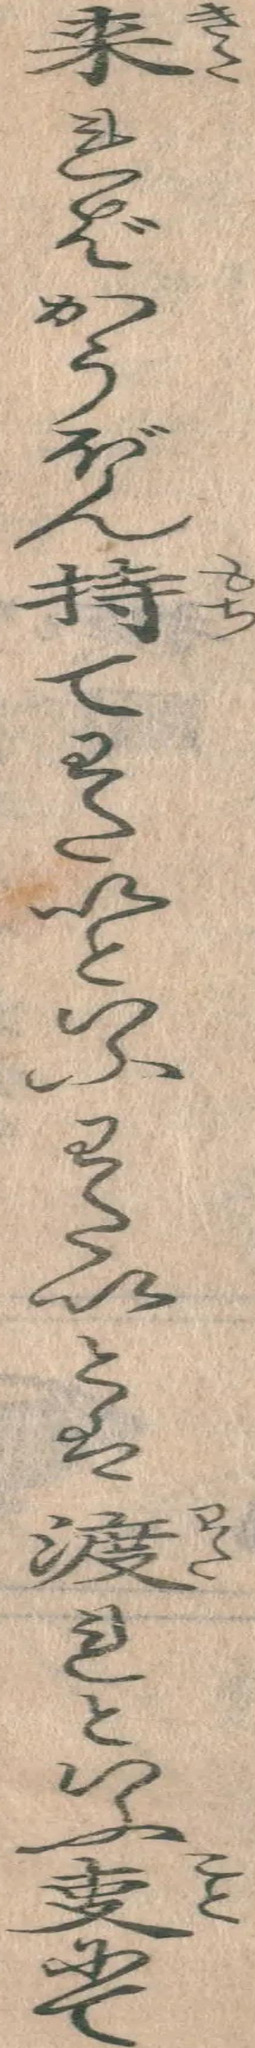来ればかうぼん持てわたいといふわたいとは渡れといふ事にて
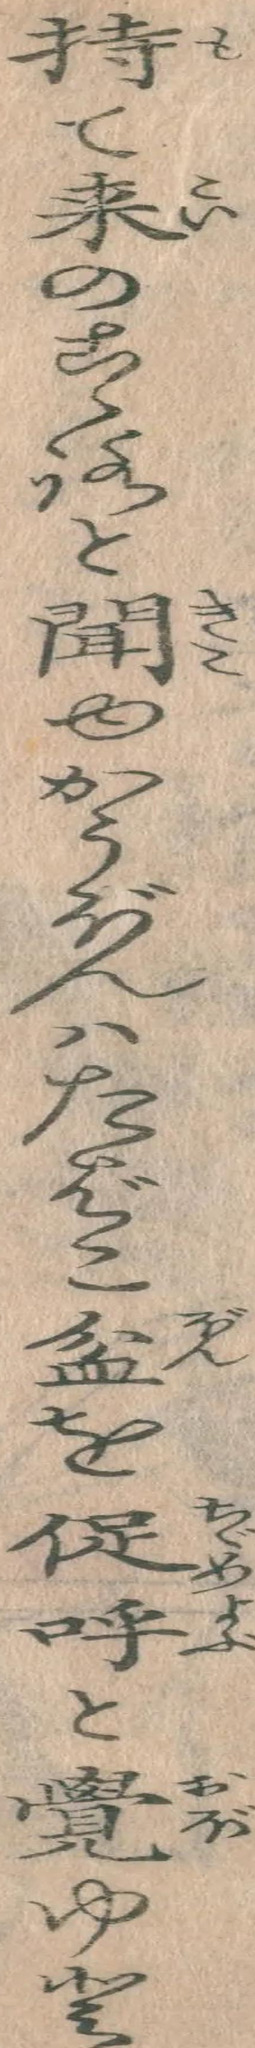持て来のこゝろと聞ゆかうぼんはたばこ盆を促呼と覚ゆと
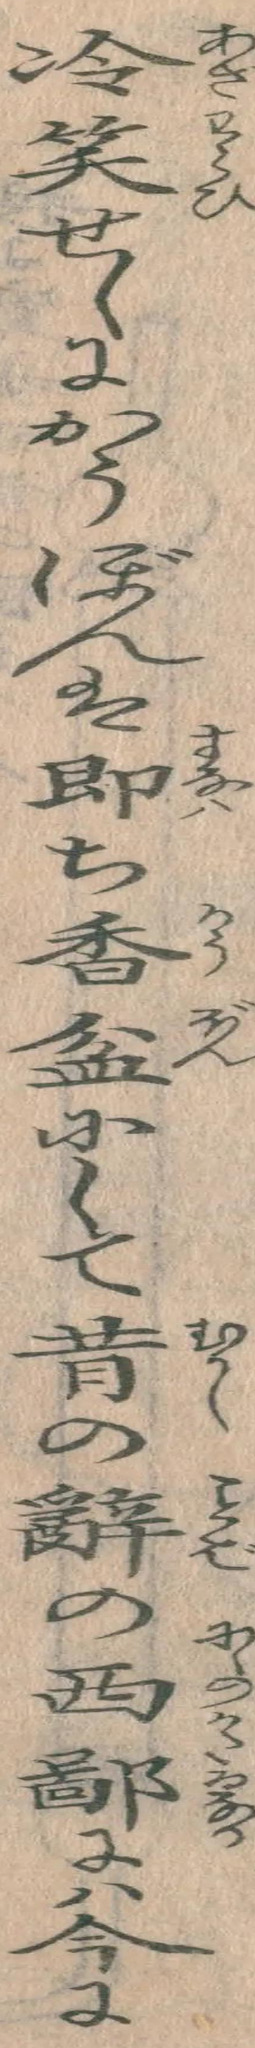冷笑せしにかうぼんは即ち香盆にして昔の辞の西鄙には今に
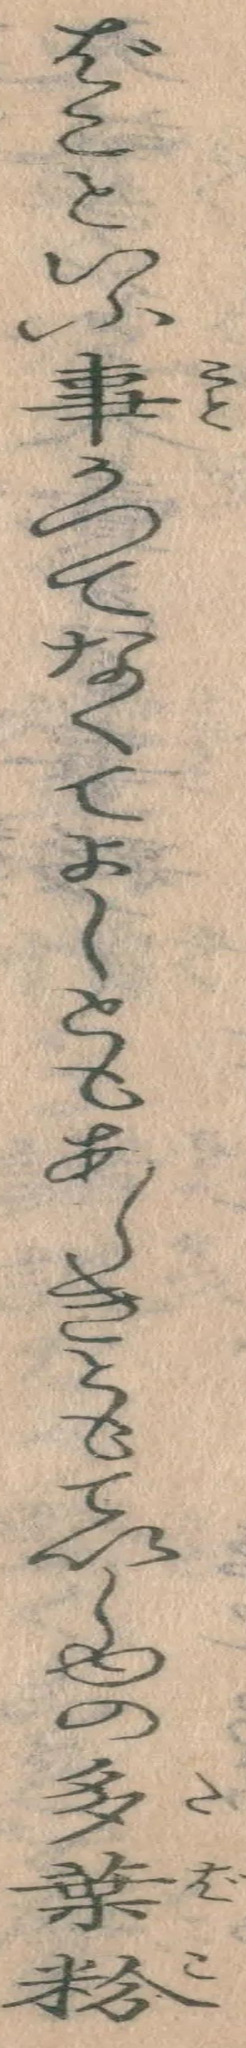ばこといふ事かつてなくてよしともあしきともていしゆの多葉粉
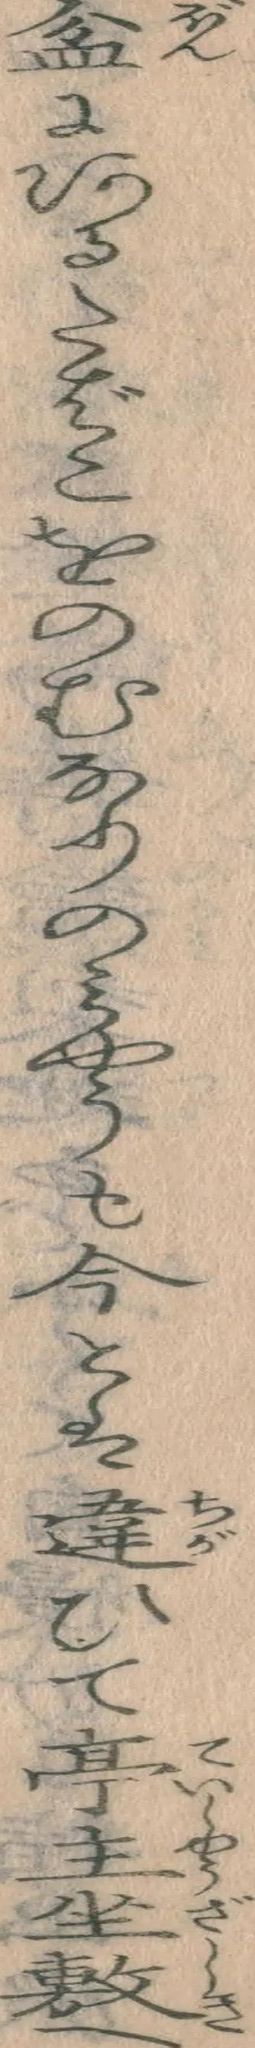盆にあるたばこをのむなりのみやうも今とは違ひて亭主坐敷へ
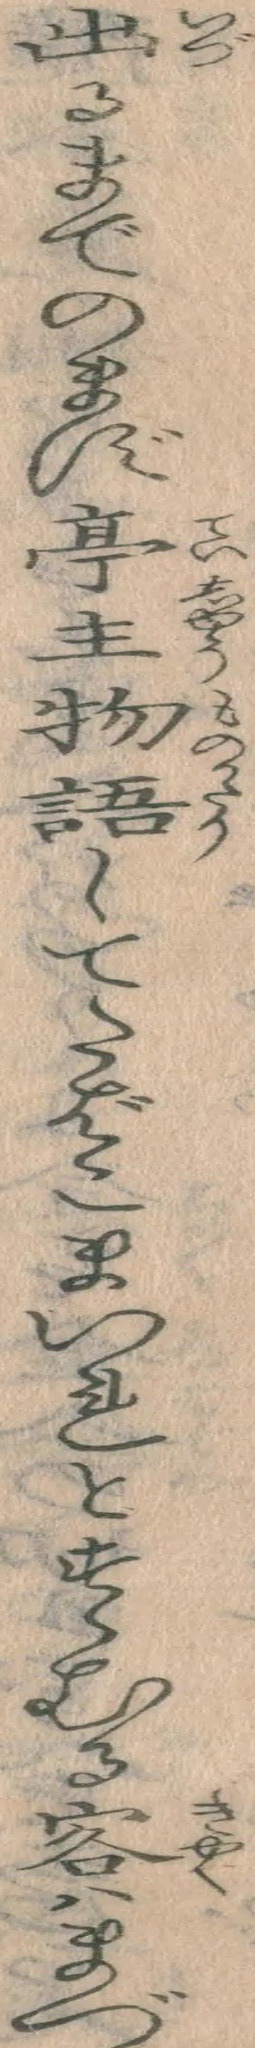出るまでのまず亭主物語してたばこまいれとすゝむる客はまづ
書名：目さまし草
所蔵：国立国会図書館 National Diet Library, JAPAN
